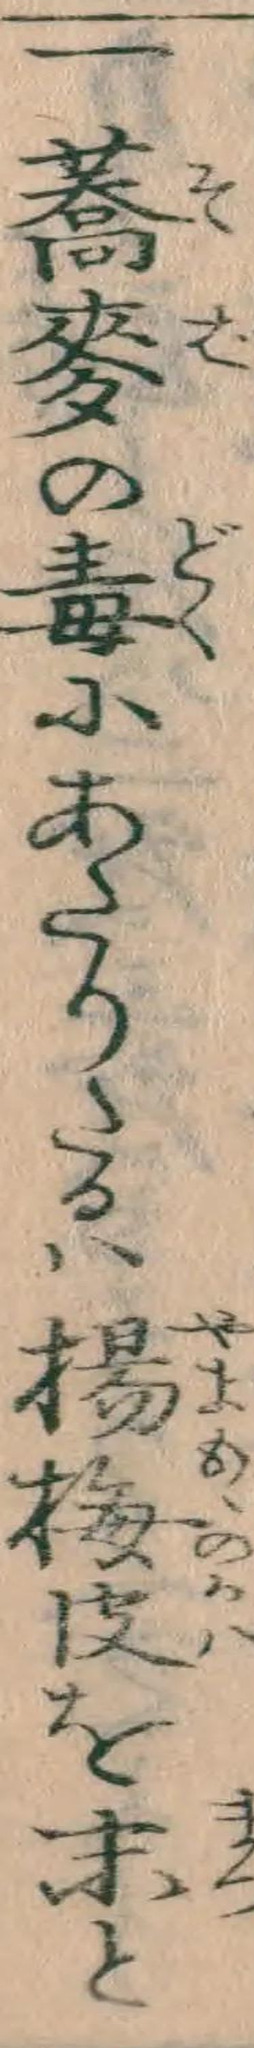一蕎麦の毒にあたりたるは楊梅皮を末と
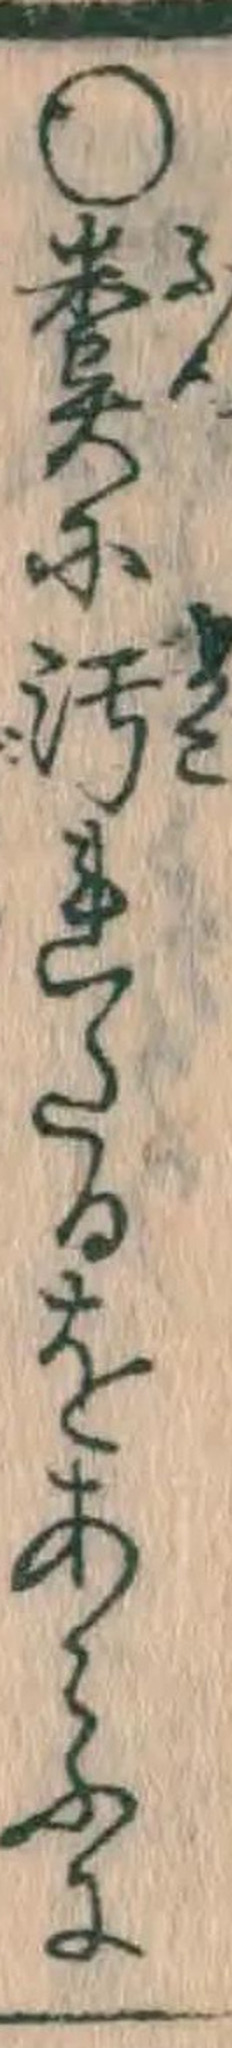○糞に汚れたるをあらふに
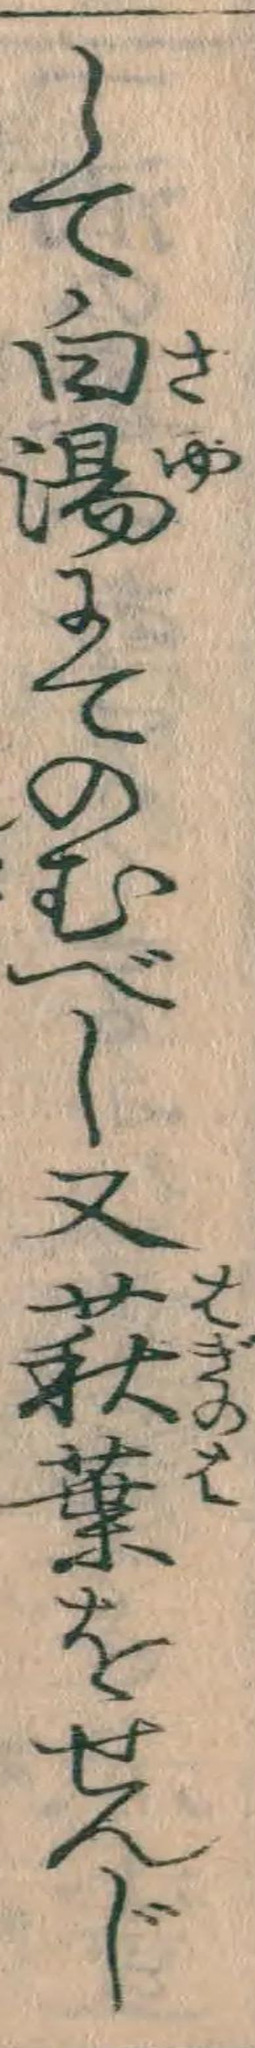して白湯にてのむべし又萩葉をせんじ
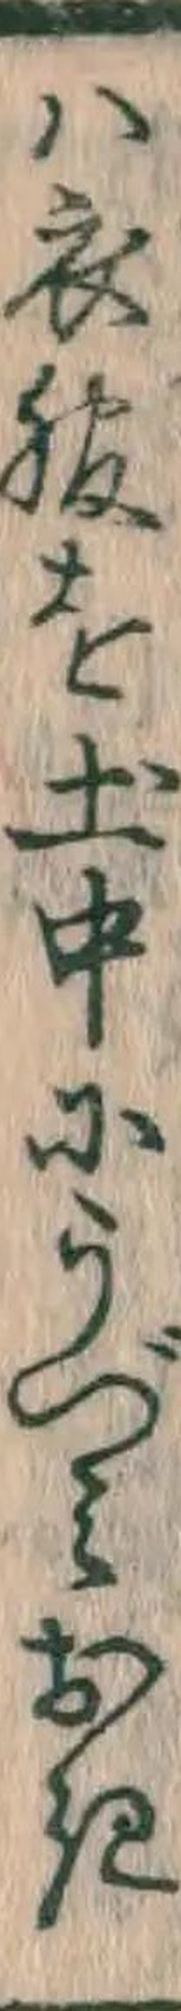は衣服を土中にうづみおき
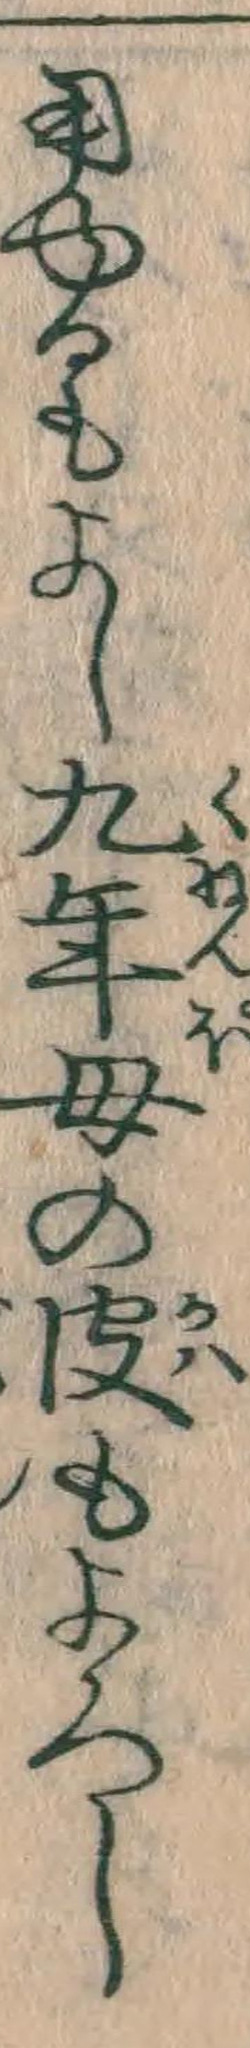用ゆるもよし九年母の皮もよろし
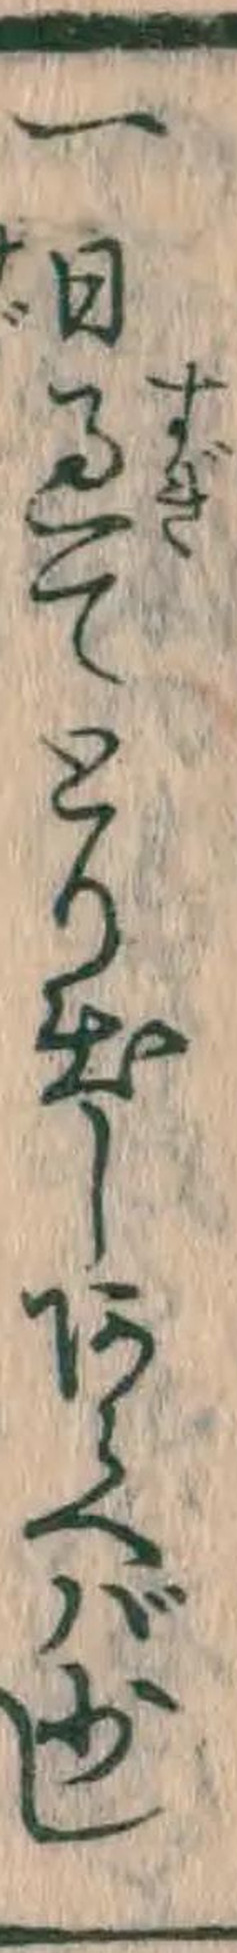一日過てとり出しあらへば少し
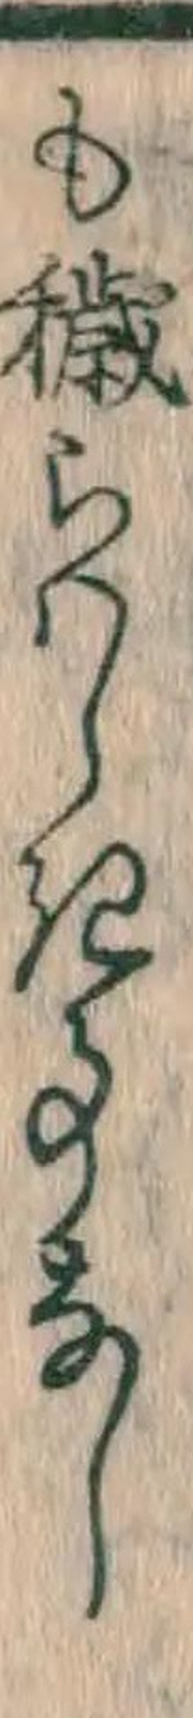も穢らはしき事なし
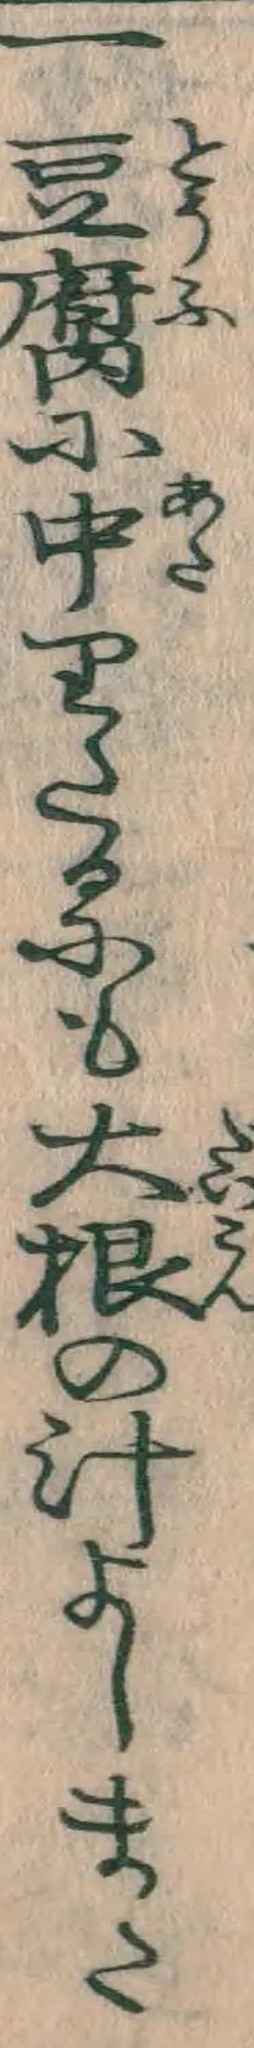一豆腐に中りたるにも大根の汁よしまた
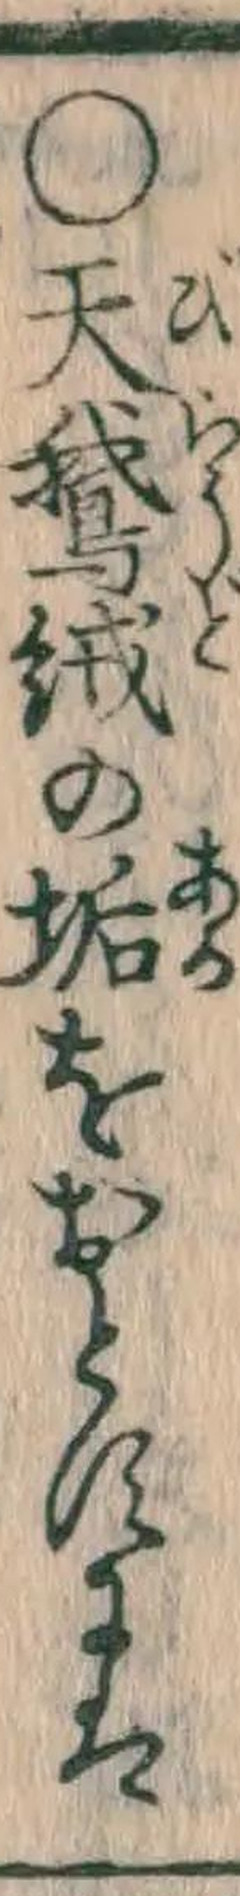○天鵞絨の垢をおとすには
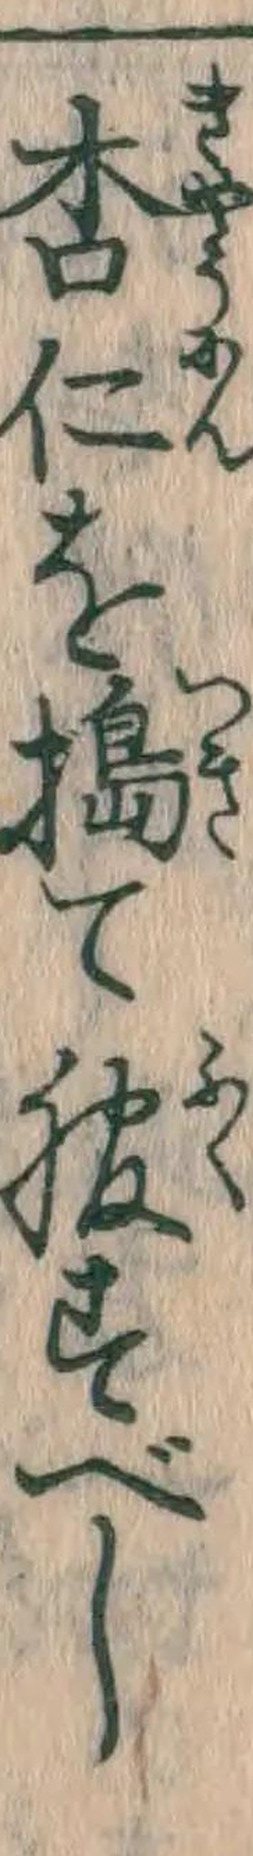杏仁を搗て服すべし
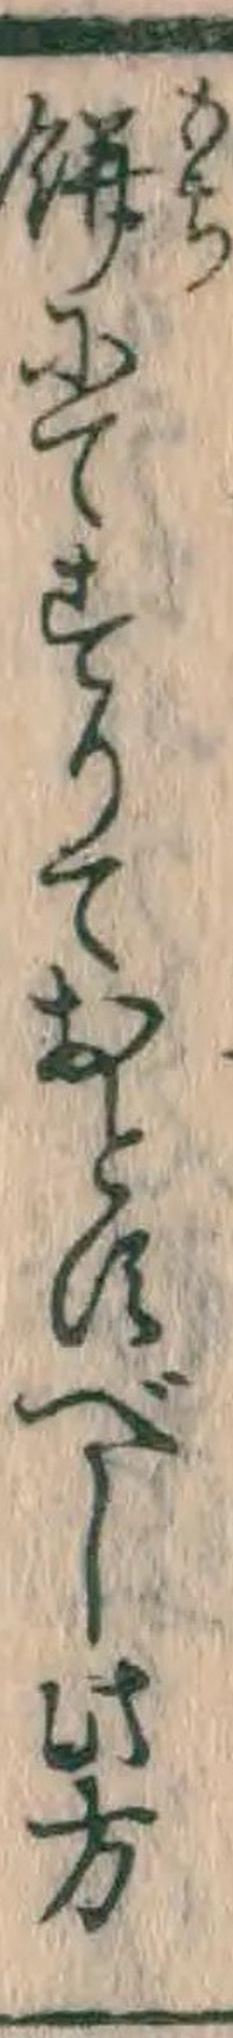餅にてすりておとすべし此方
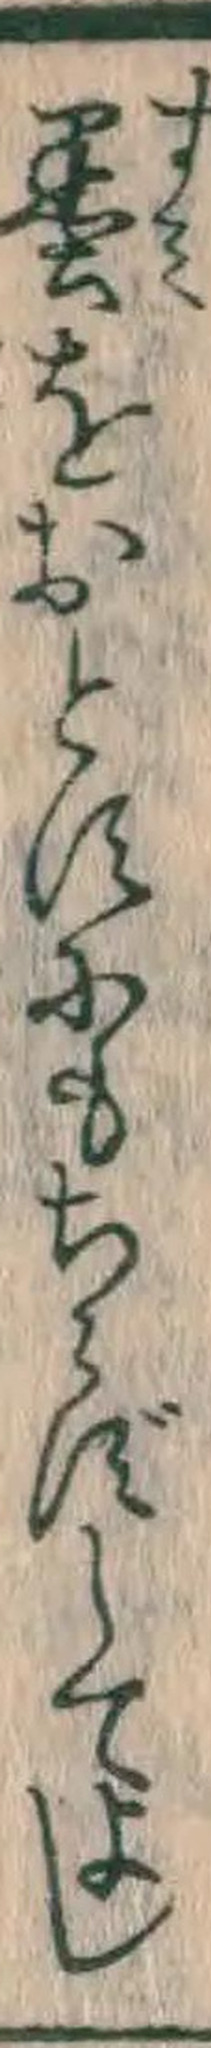墨をおとすにもちらずしてよし
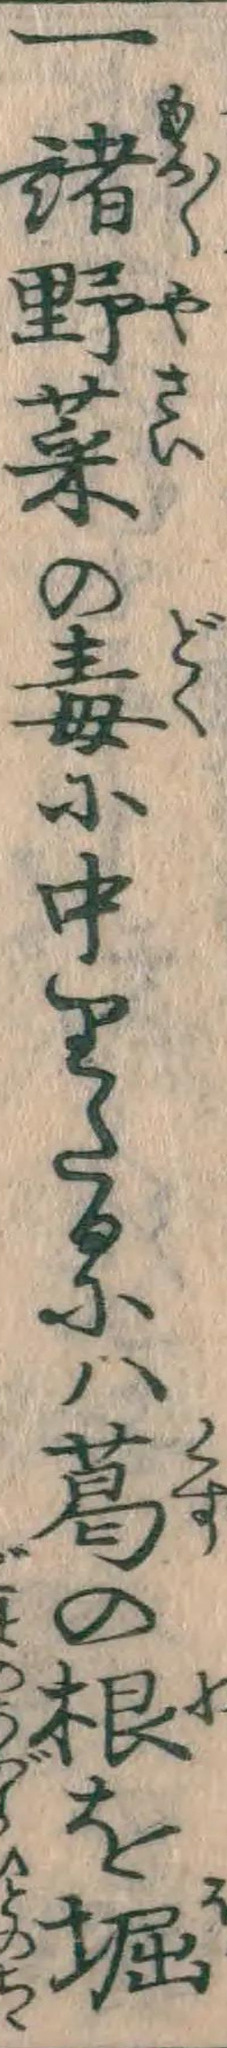一諸野菜の毒に中りたるには葛の根を掘
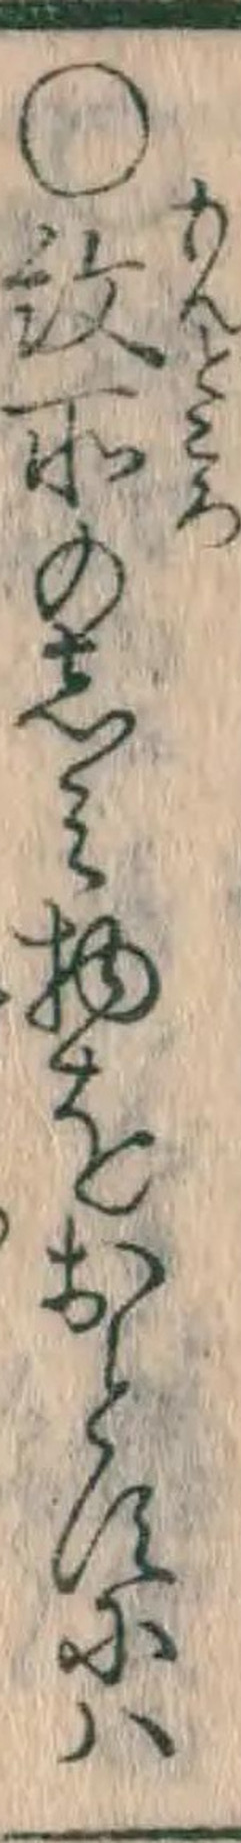○紋所のしみ物をおとすには
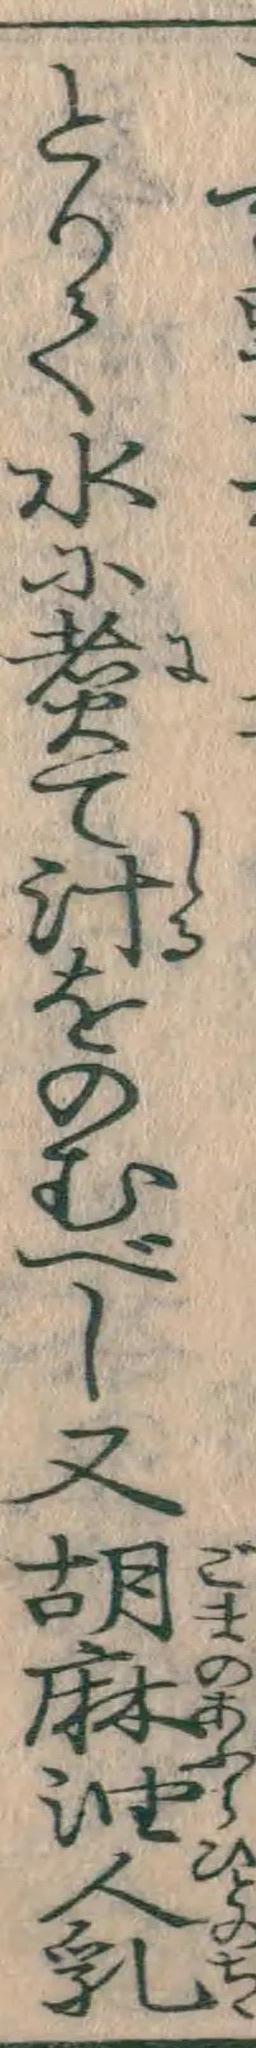とりて水に煮て汁をのむべし又胡麻油人乳
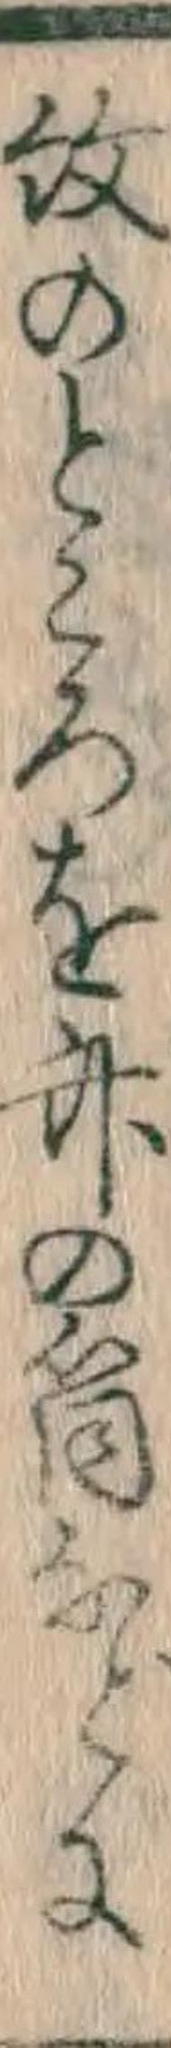紋のところを竹の筒などに
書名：広益秘事大全 3巻. [3]
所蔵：国立国会図書館 National Diet Library, JAPAN
